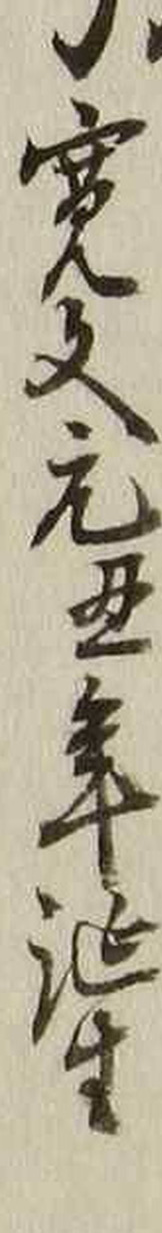寛文元丑年誕生
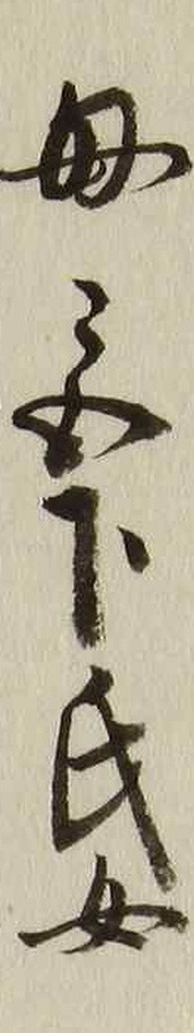母宮下氏女
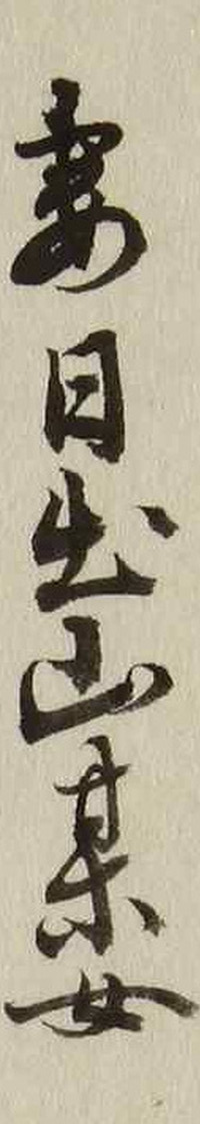妻日出山某女
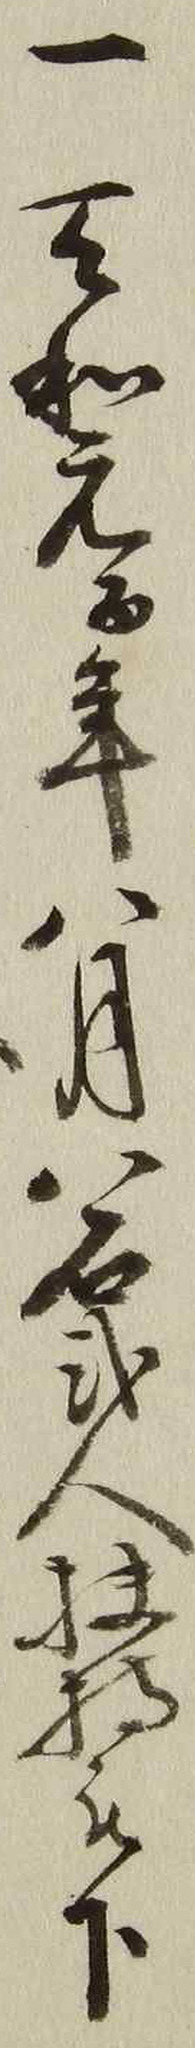一天和元酉年八月八石弐人扶持被下
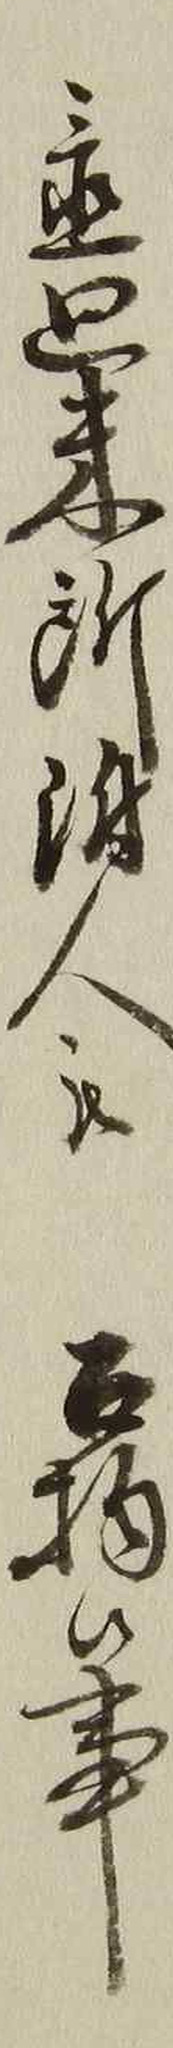置廻米所附人被召拘候事
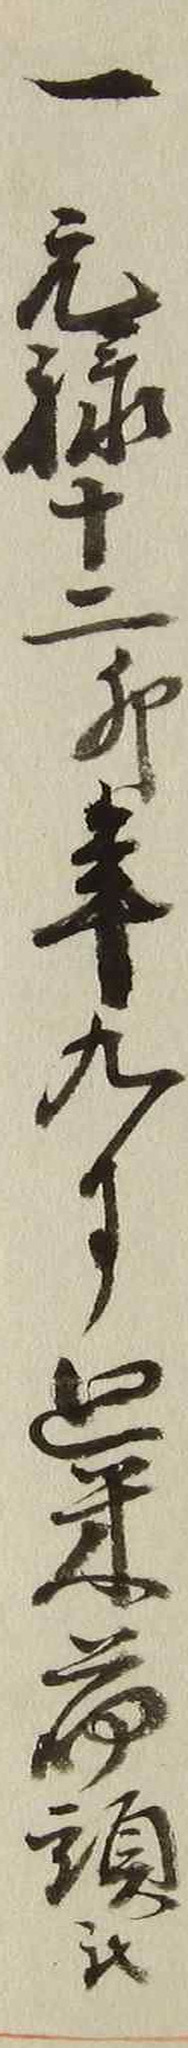一元禄十二卯年九月廻米荷頭被
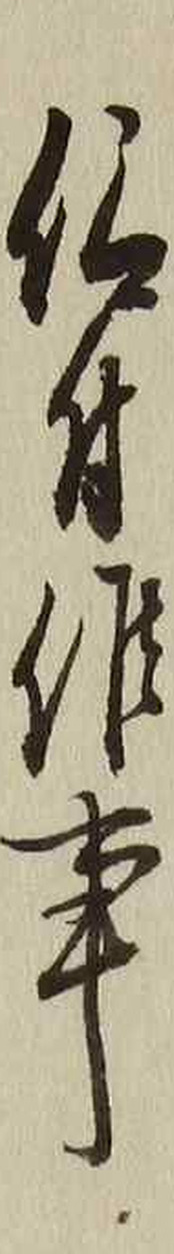仰付候事
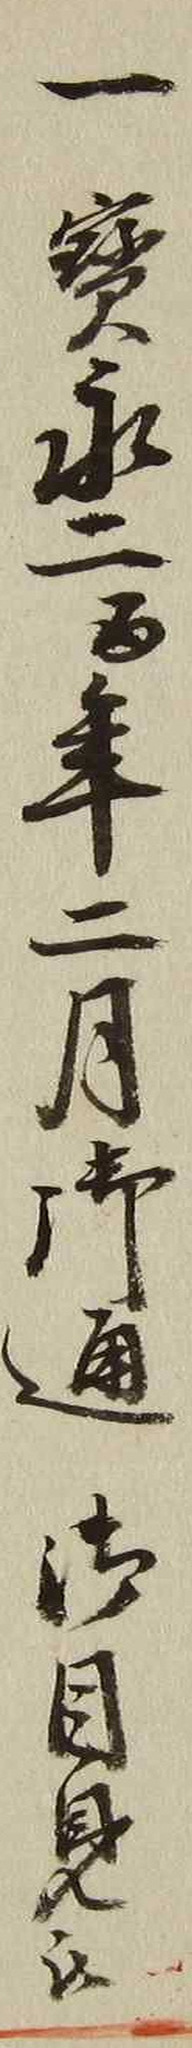一宝永二酉年二月御通御目見被
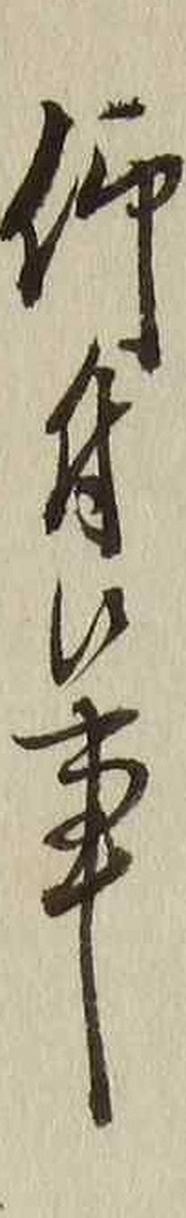仰付候事
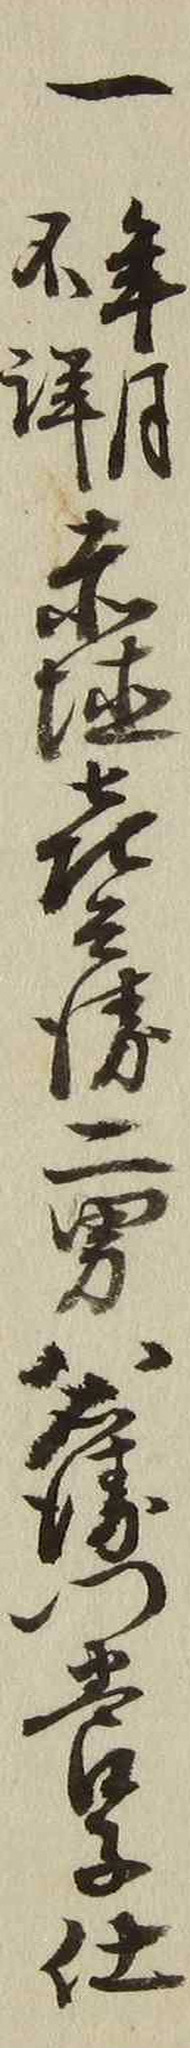不詳赤埴喜兵衛二男八右衛門養子仕
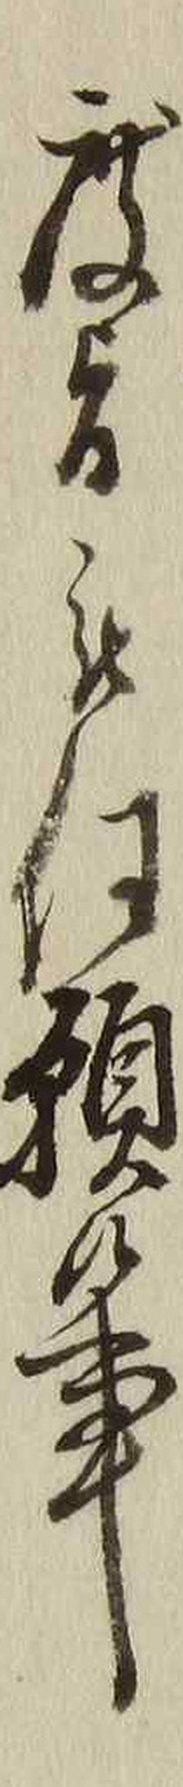度旨被任願候事
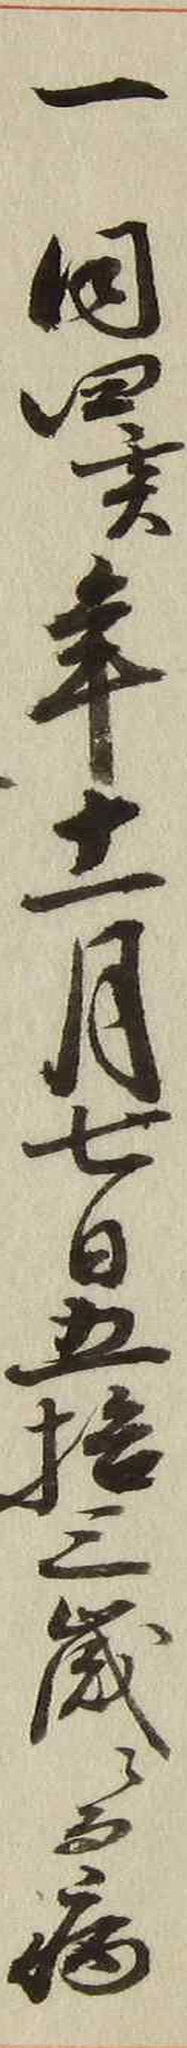一同四亥年十一月七日五拾三歳ニ而病
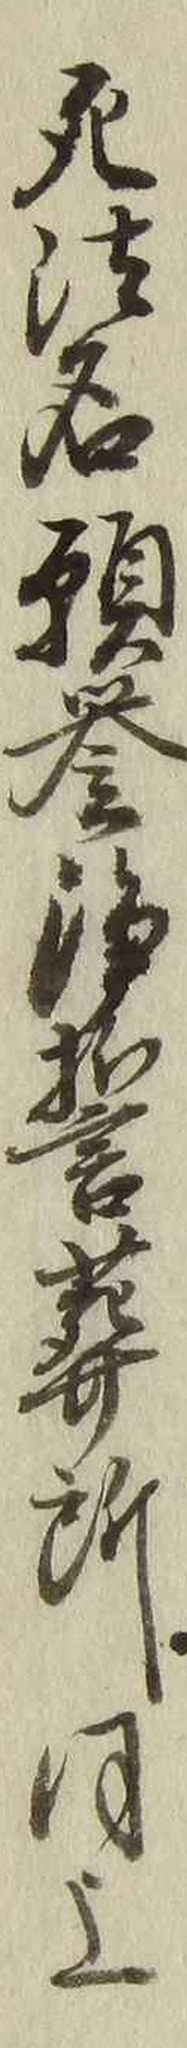死法名願誉浄誓葬所同上
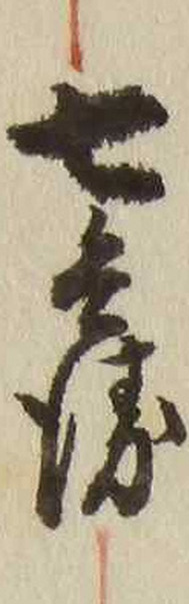七兵衛
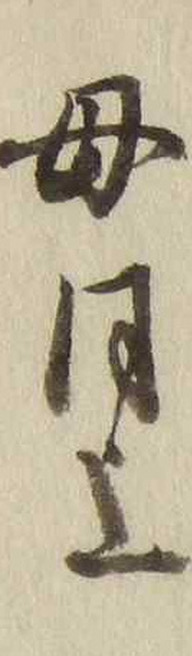母同上

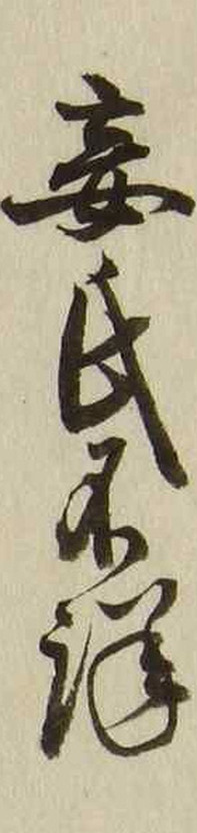妾氏不詳
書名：諸士系譜　巻之27　い之部27
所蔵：会津若松市立会津図書館
